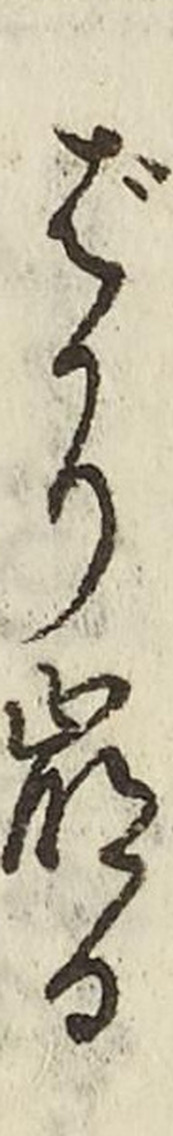ばかり崩る
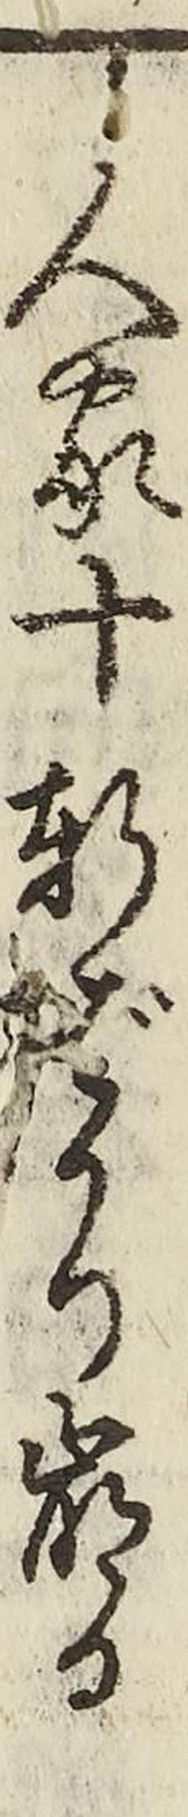人家十軒ばかり崩る
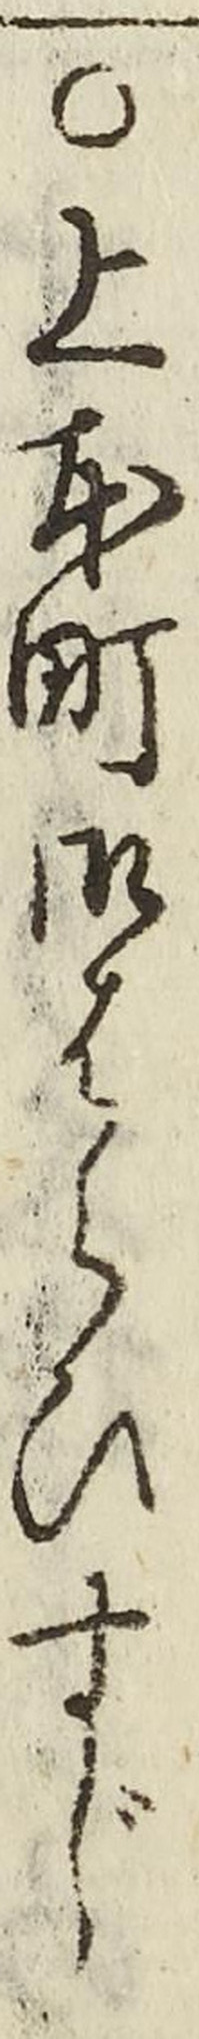○上本町御はらひすじ
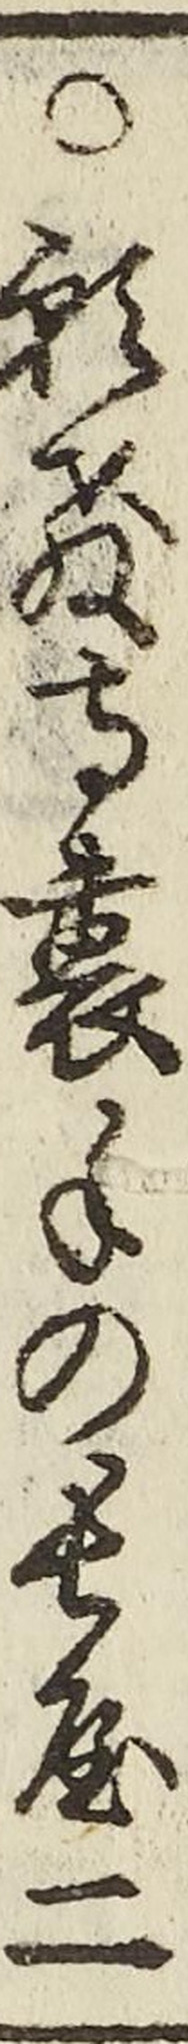○願教寺裏手の長屋二
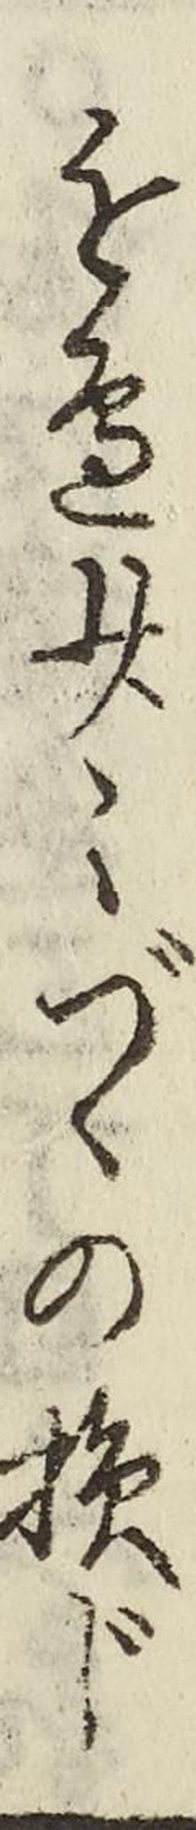近辺少々づゝの損じ
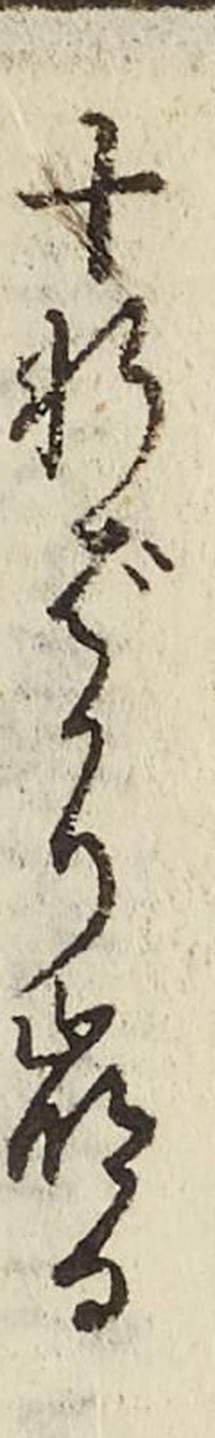十軒ばかり崩る
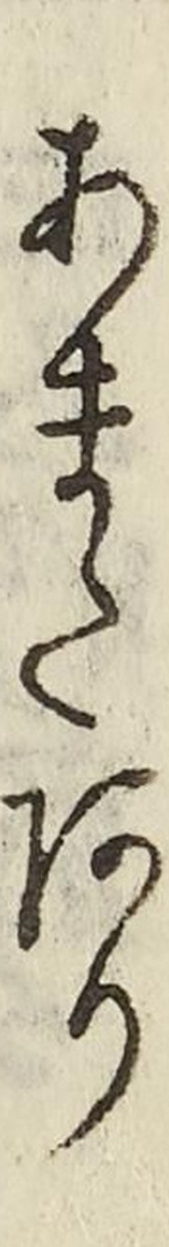あまたあり
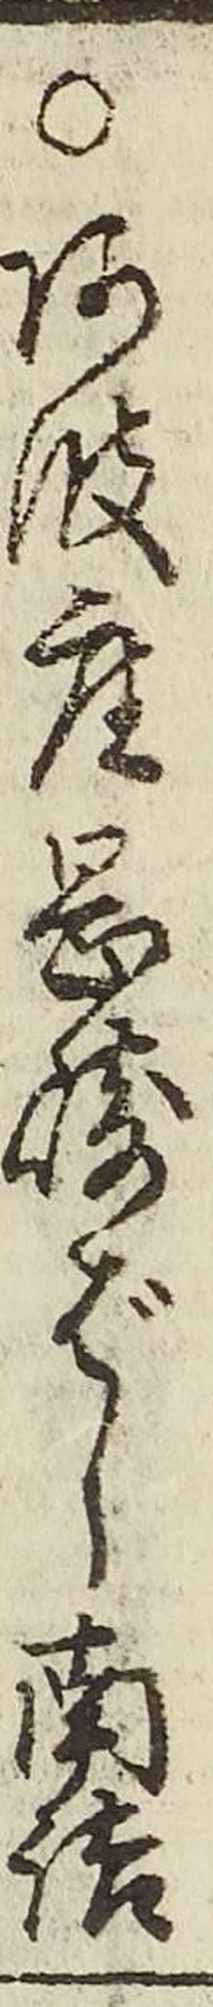○阿波座岡崎ばし南詰
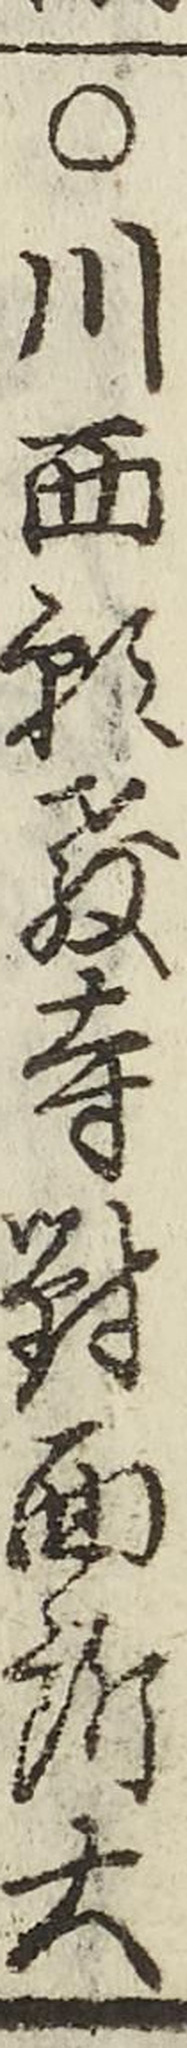○川西願教寺対面所大
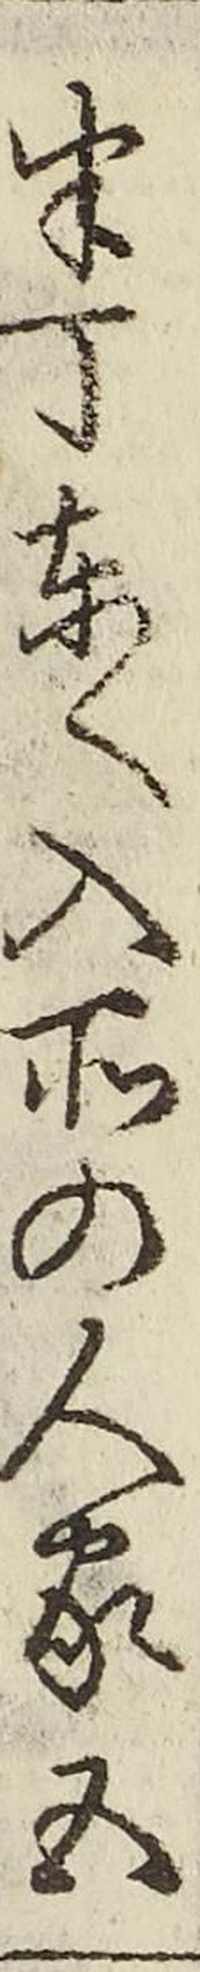半丁東へ入所の人家五
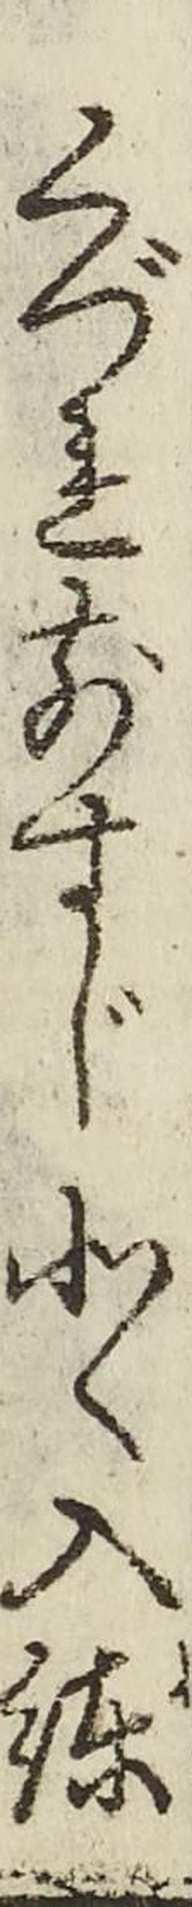くづれ前すじ北へ入練
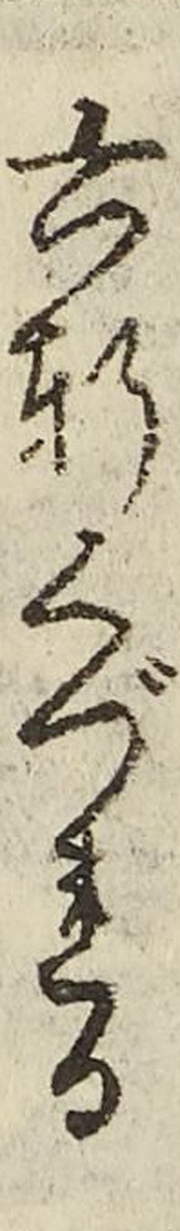六軒くづれる
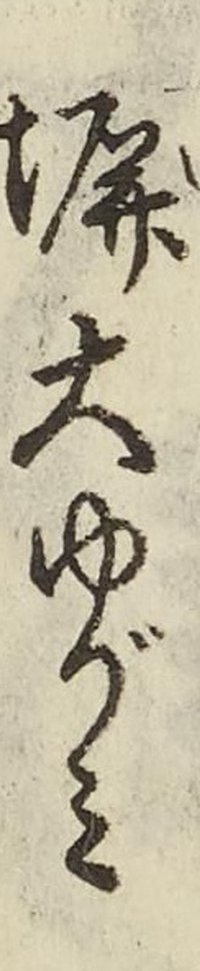塀大ゆがみ

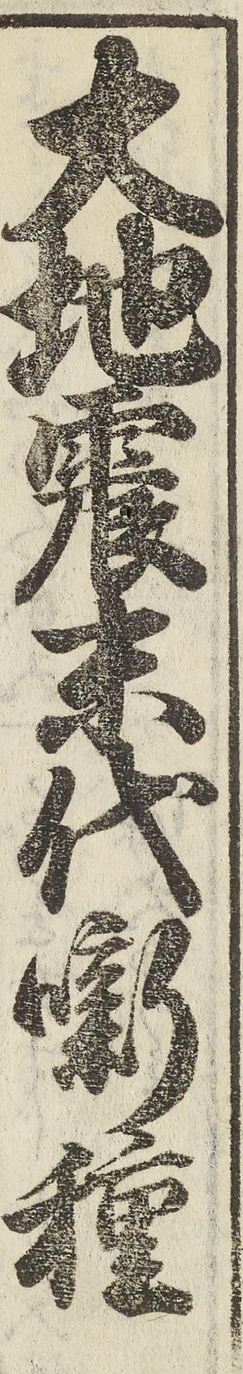大地震末代噺種
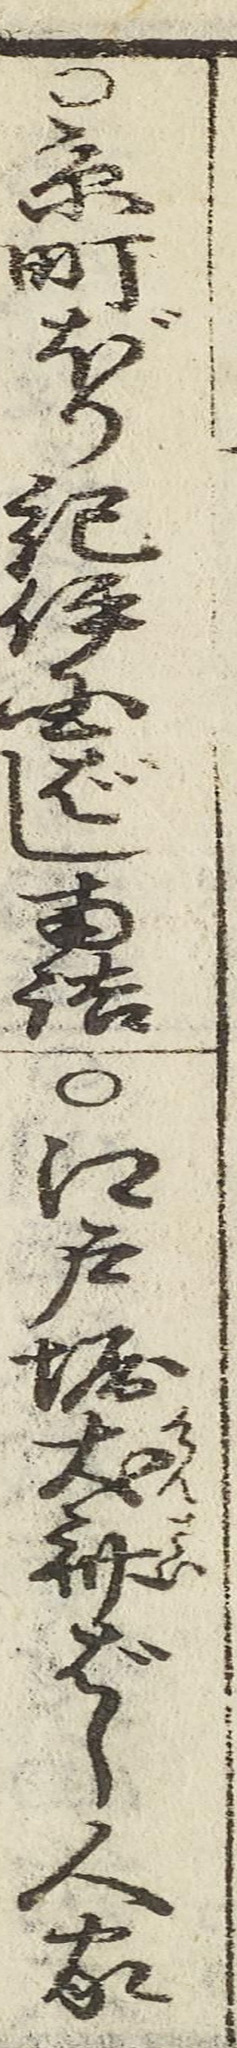○京町ぼり紀伊国ばし南詰
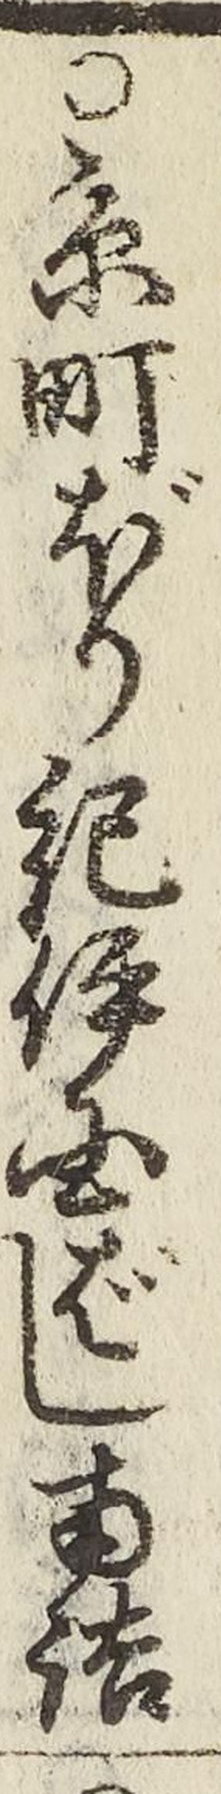○京町ぼり紀伊国ばし南詰
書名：地震津浪末代噺の種　全
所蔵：東京大学地震研究所図書室 Earthquake Research Institute Library, The University of Tokyo, JAPAN
